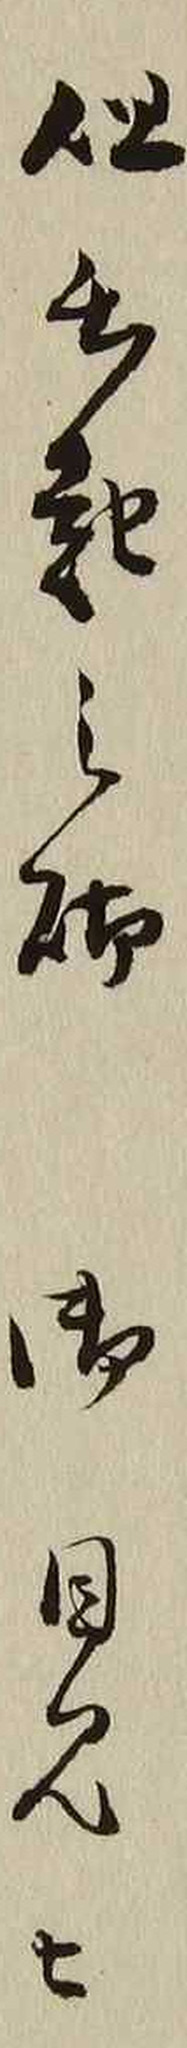但出起之砌御目見被
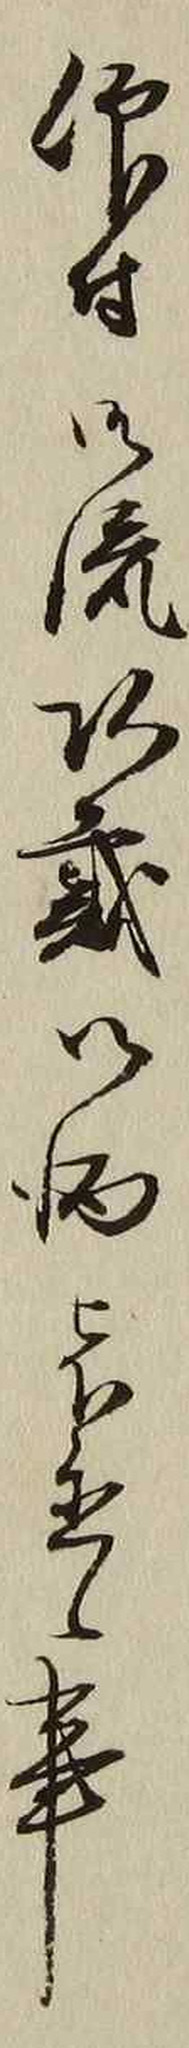仰付御流頂戴御酒被下置候事
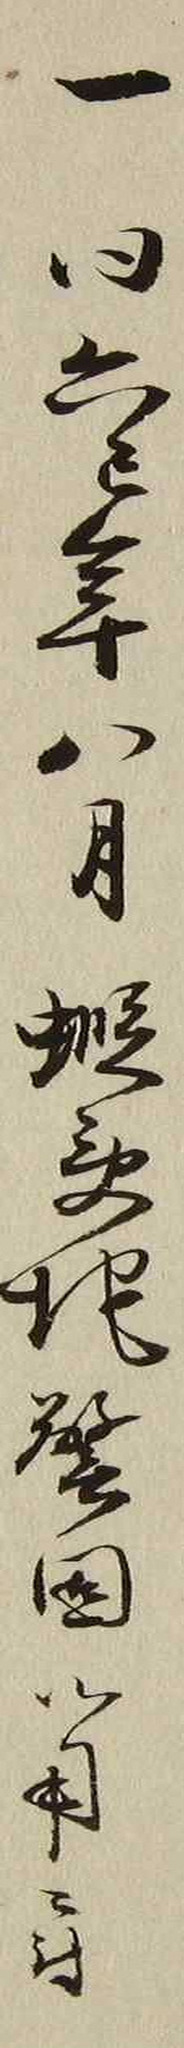一同六巳年八月蝦夷地警固御用に付
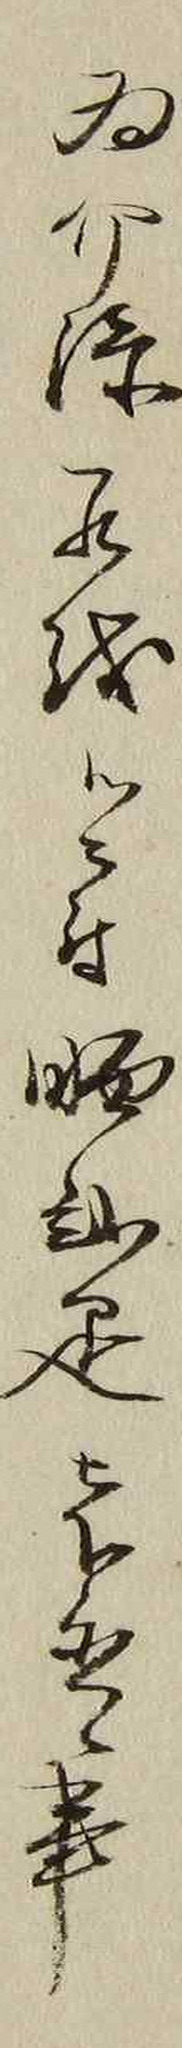為介添罷越候に付晒弐疋被下置候事
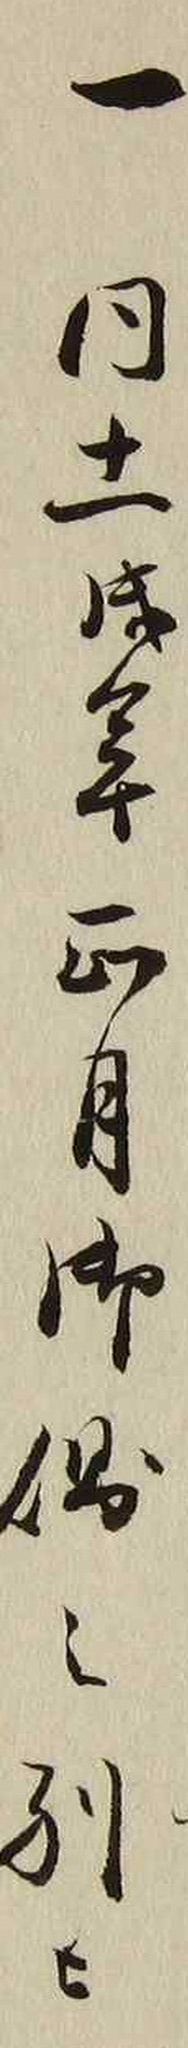一同十一戌年正月御側之列被
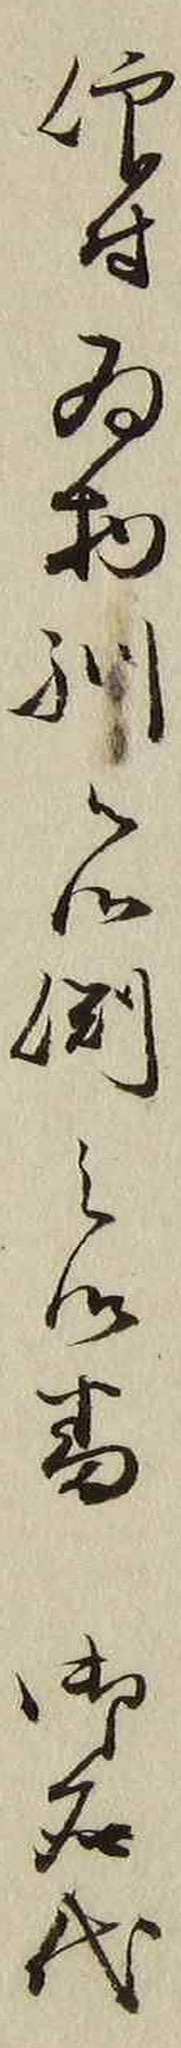仰付為物馴候御側之御番御名代
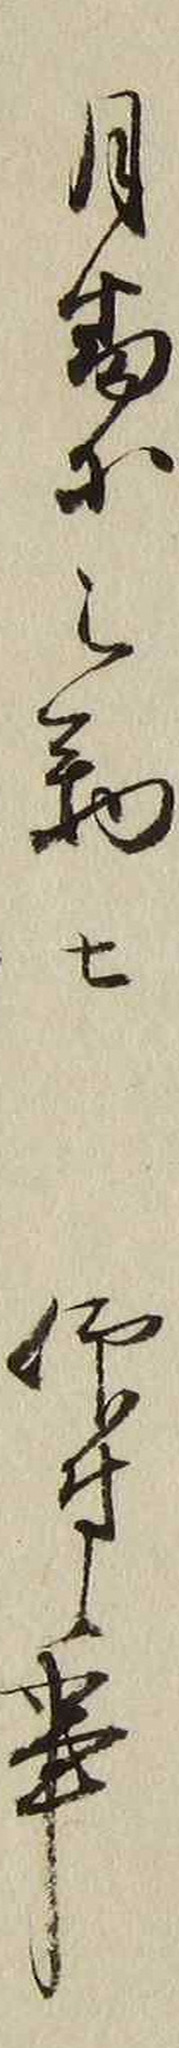月番等之勤被仰付候事
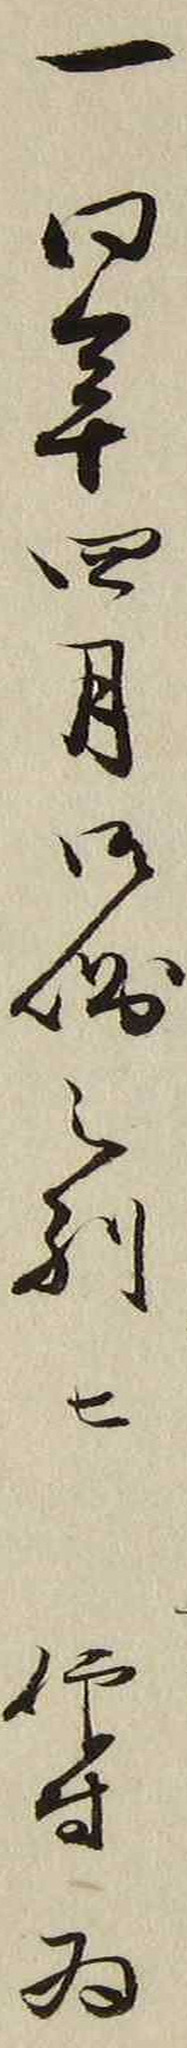一同年四月御側之列被仰付為
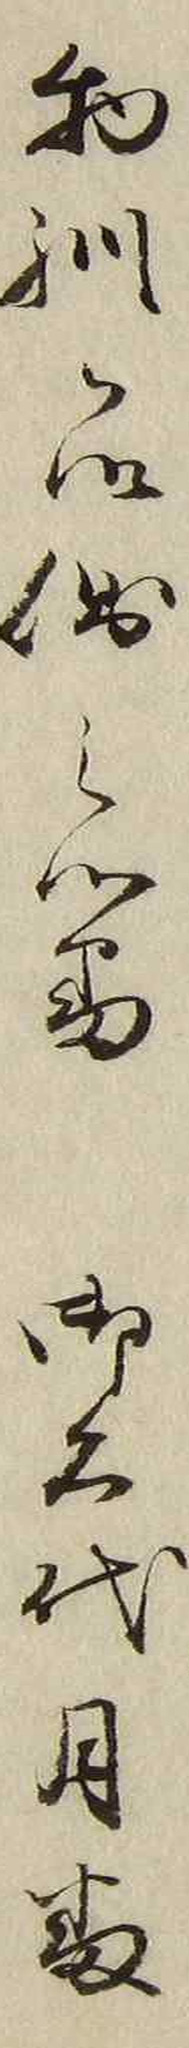物馴候御側之御番御名代月番
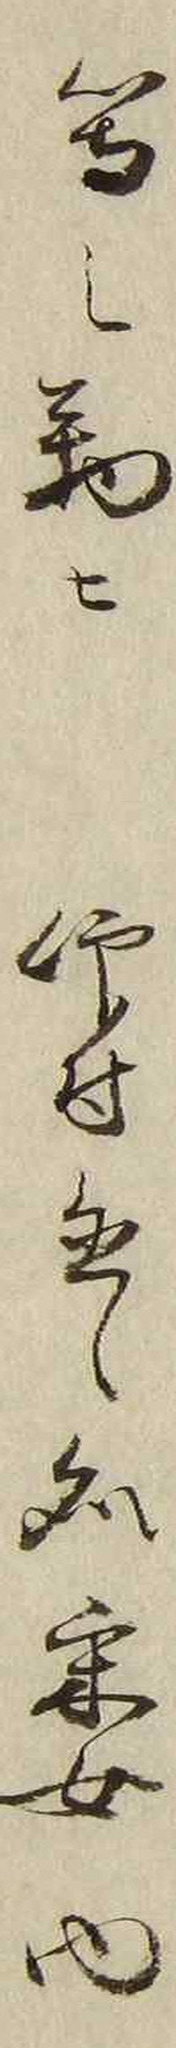等之勤被仰付置之処采女内

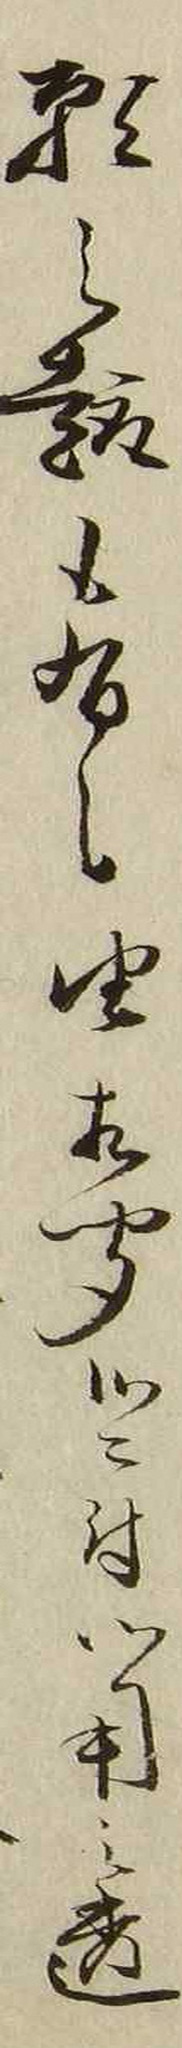願之趣も有之由相聞候に付御用之遣
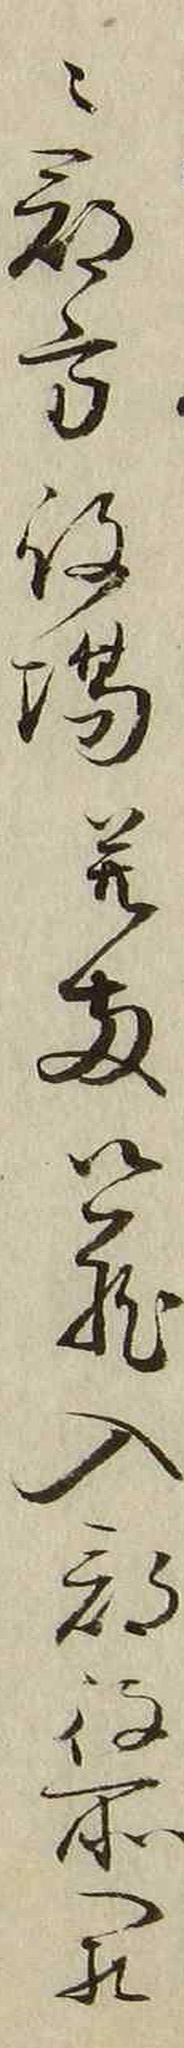方部方役場并両御蔵入部役所へ罷
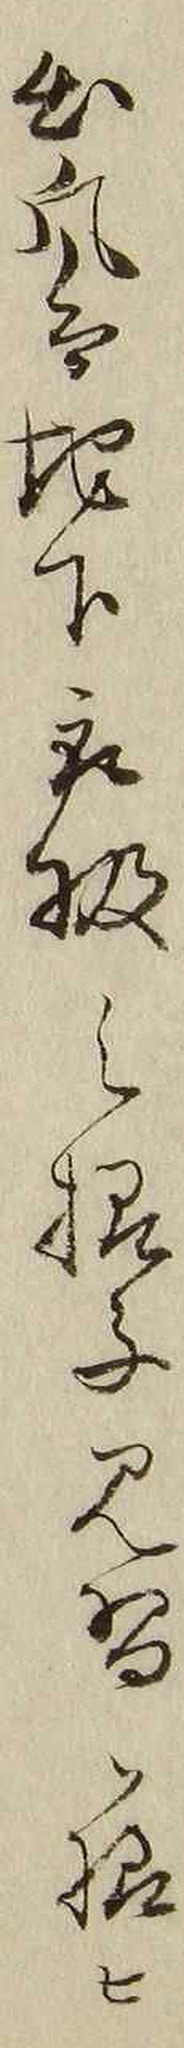出凡而地下取扱之様子見習候様被
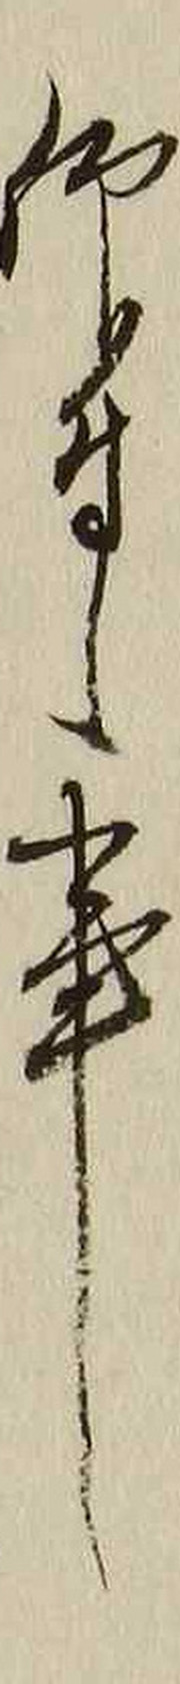仰付候事
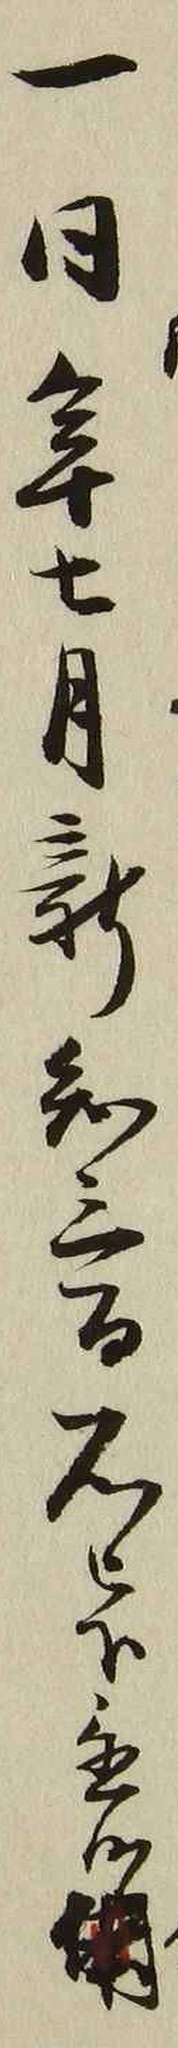一同年七月新知三百石被下置御供
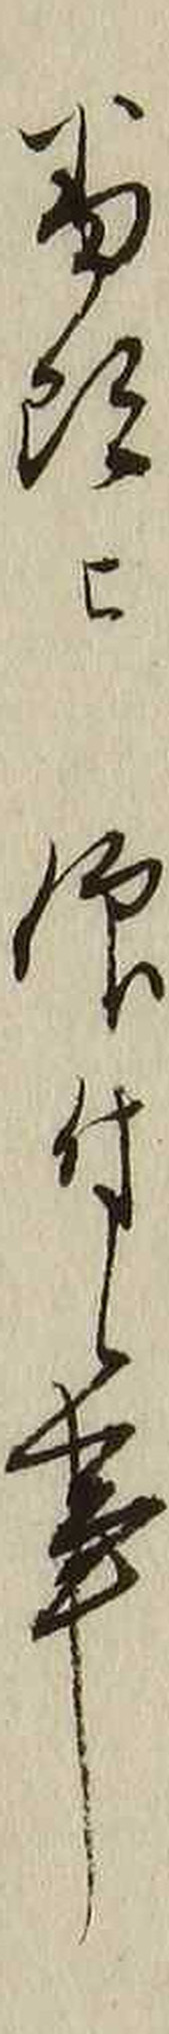番頭被仰付候事
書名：諸士系譜　巻之292　き之部1
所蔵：会津若松市立会津図書館
